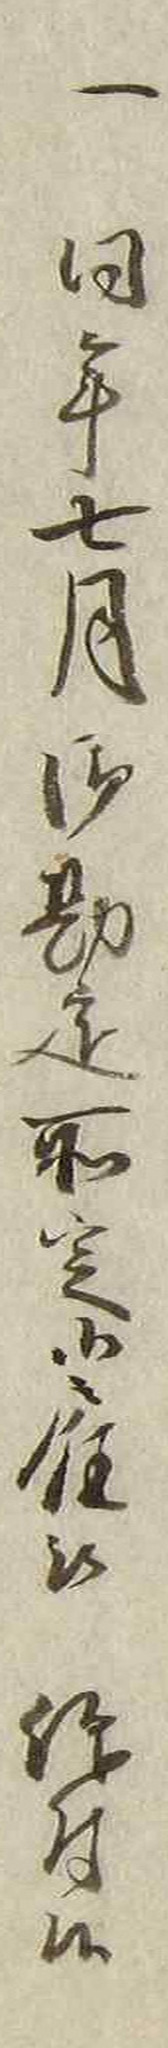一同年七月御勘定所定御雇被仰付候
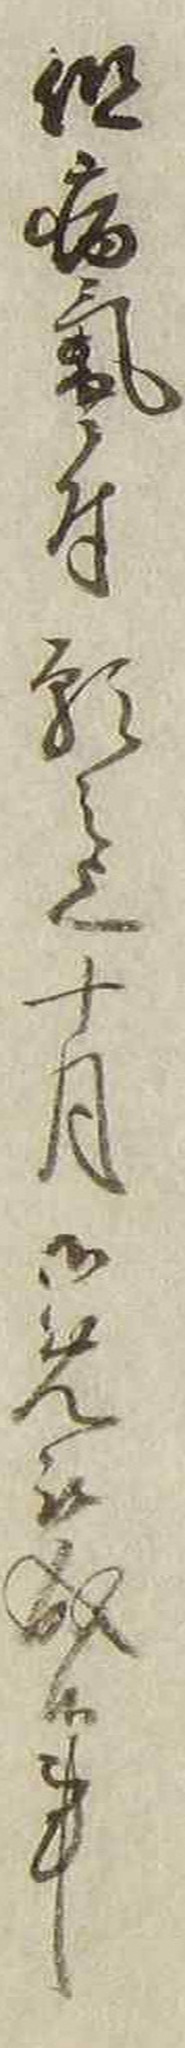但病気ニ付願之上十月御免被成候事
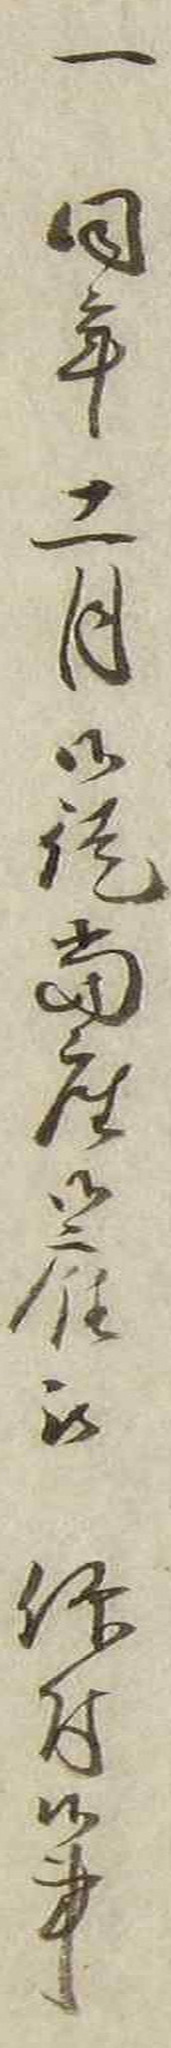一同年十一月御徒当座御雇被仰付候事

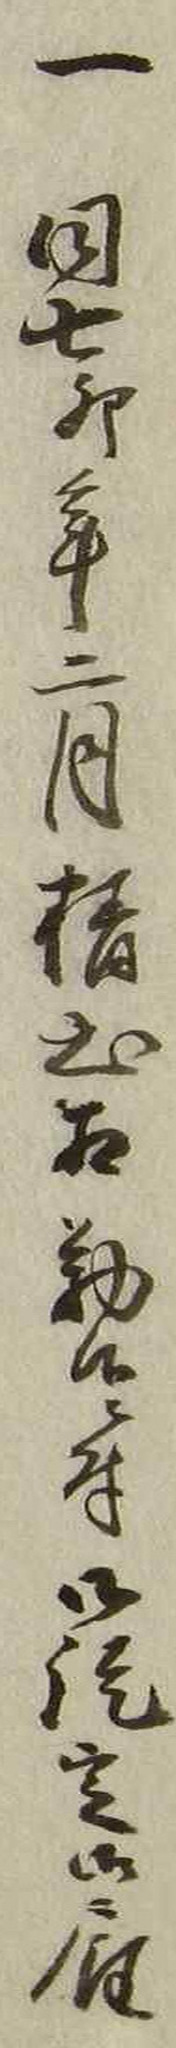一同七卯年二月精出相勤候ニ付御徒定御雇
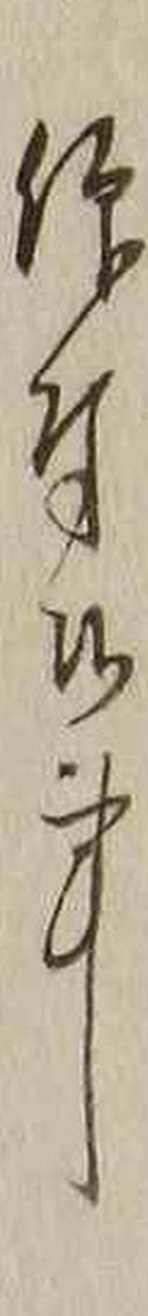仰付候事
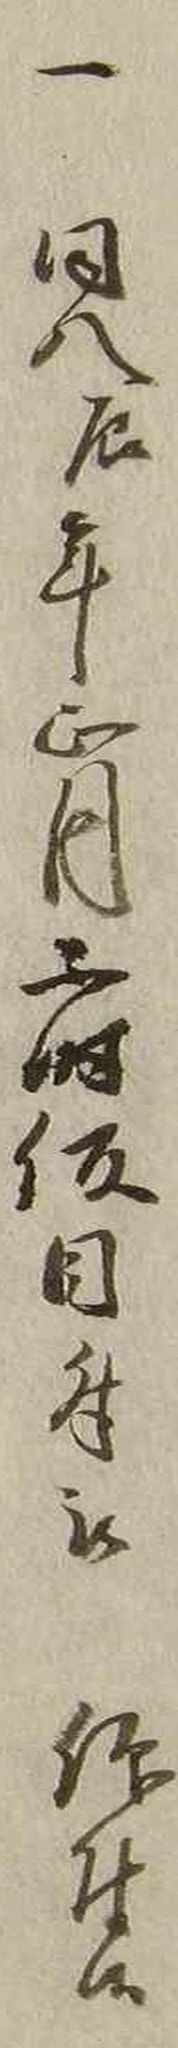一同八辰年正月不時仮目付被仰付候
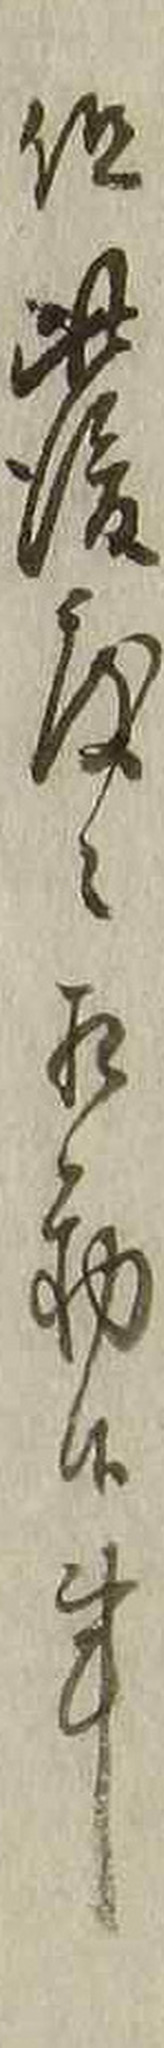但此後度々相勤候事
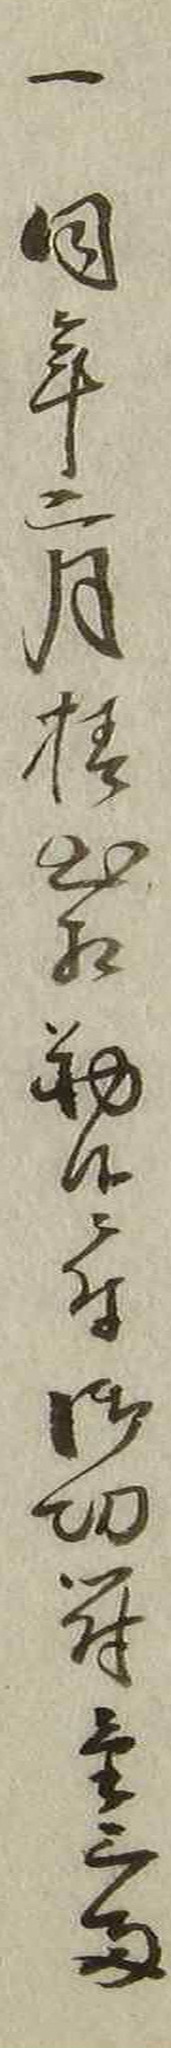一同年二月精出相勤候ニ付御切符金三両
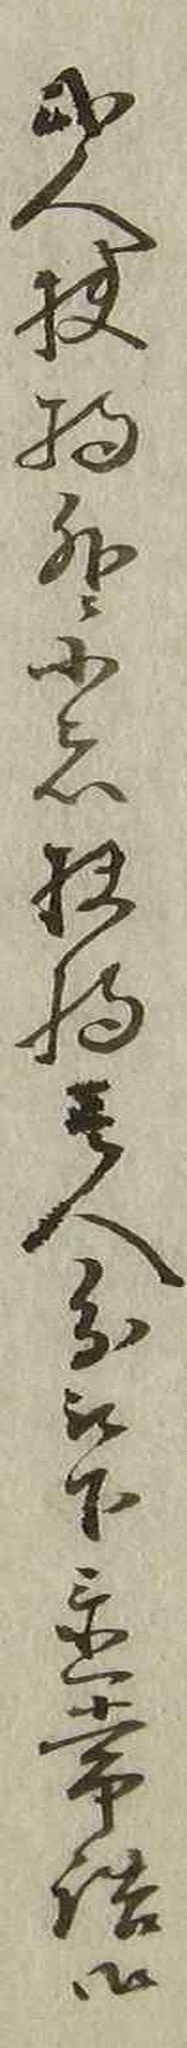弐人扶持外ニ小者扶持壱人分被下置常詰御
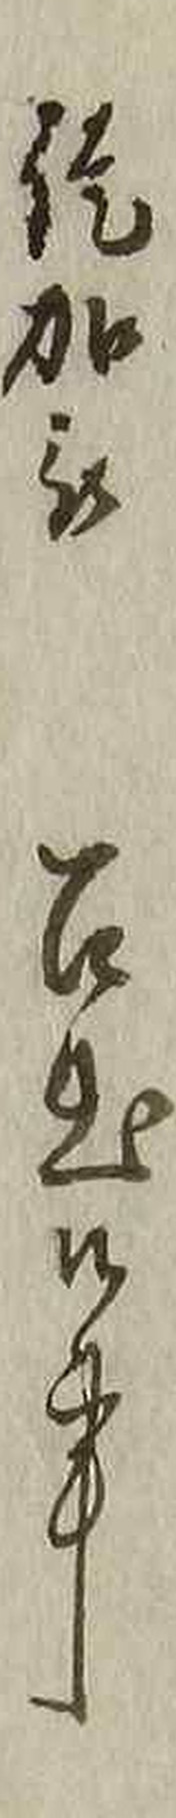徒加被召出候事
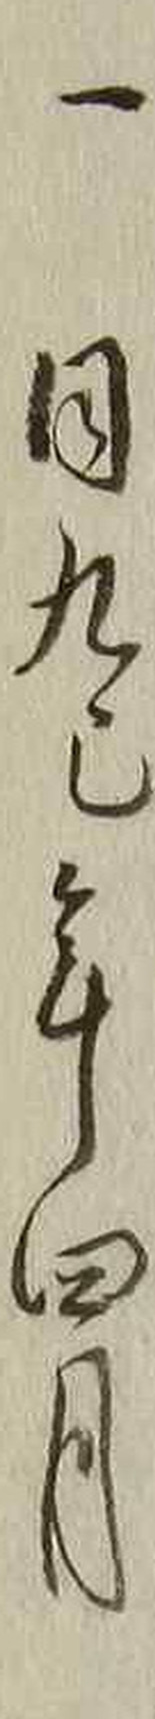一同九巳年四月
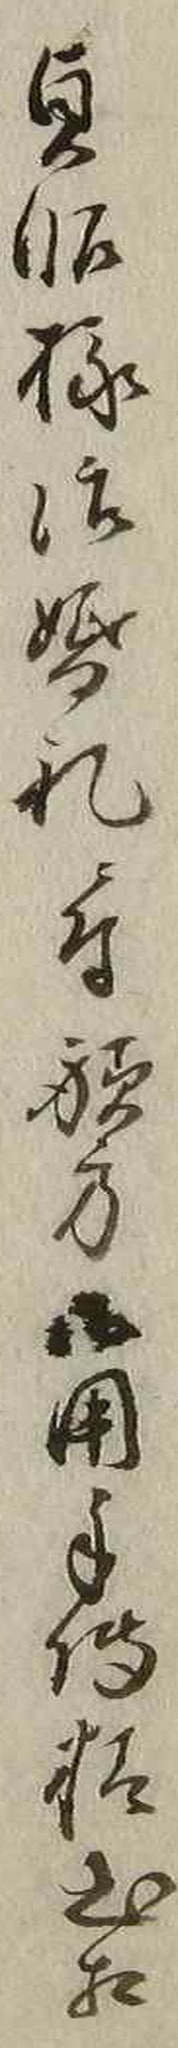貞昭様御婚礼ニ付躾方御用手伝精出相
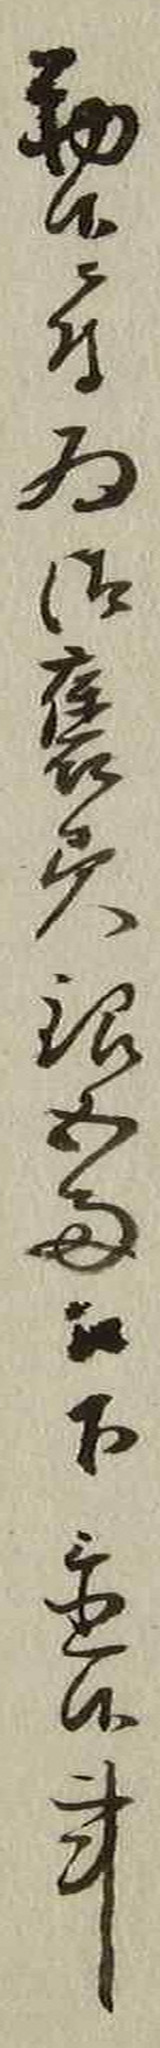勤候ニ付為御褒美銀五両被下置候事
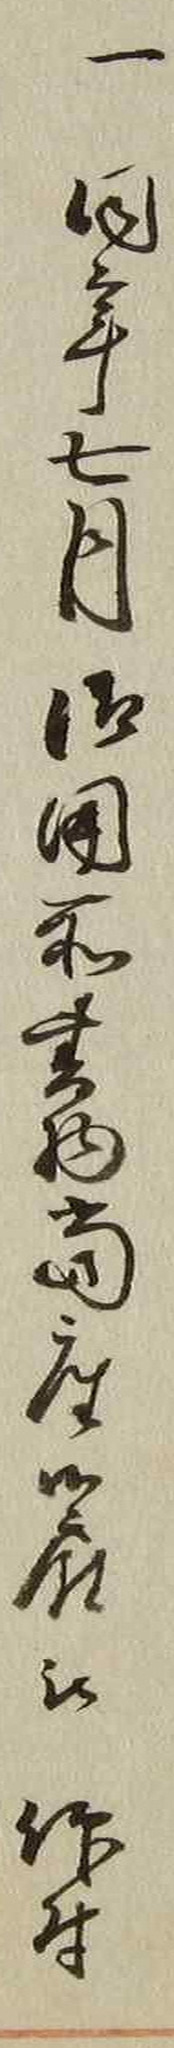一同年七月御用所書物当座御雇被仰付
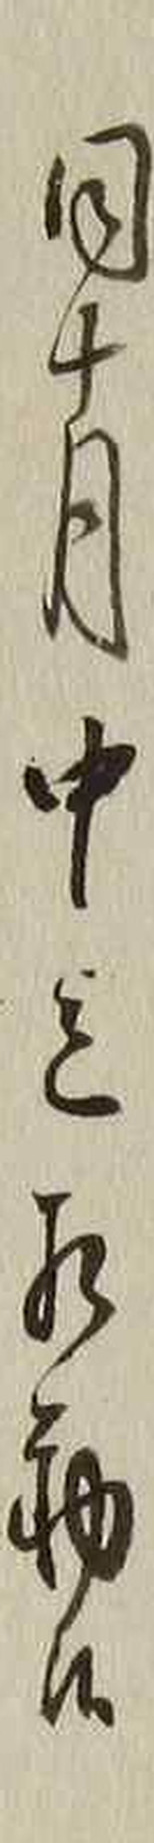同十月中迄相勤候
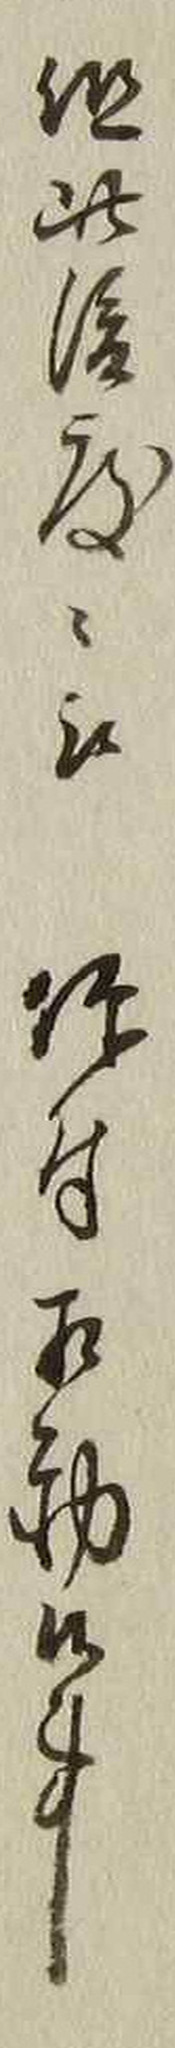但此後度々被仰付相勤候事
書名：諸士系譜　巻之132　た之部8
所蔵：会津若松市立会津図書館
